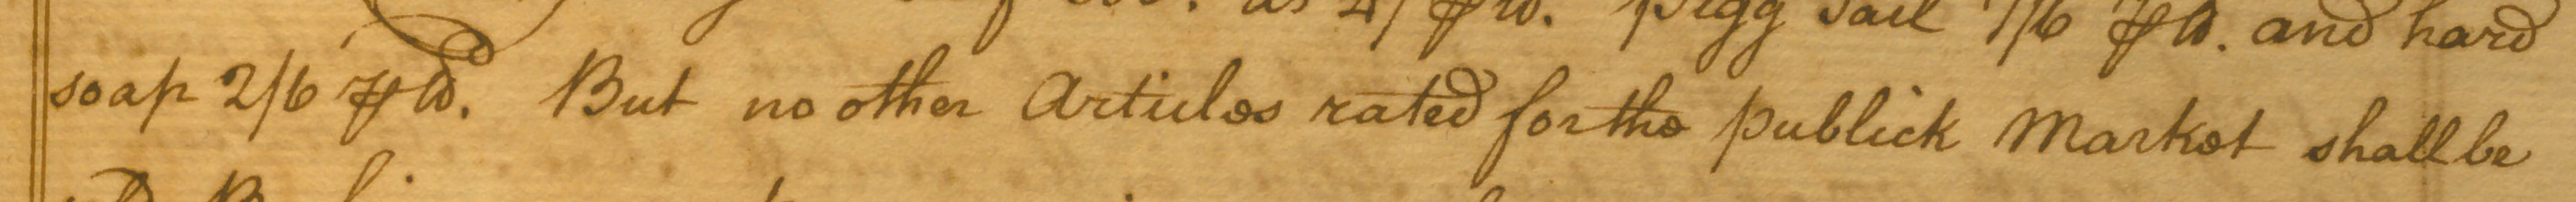soap 2s6 per lb. But no other Articles rated for the publick Market shall be
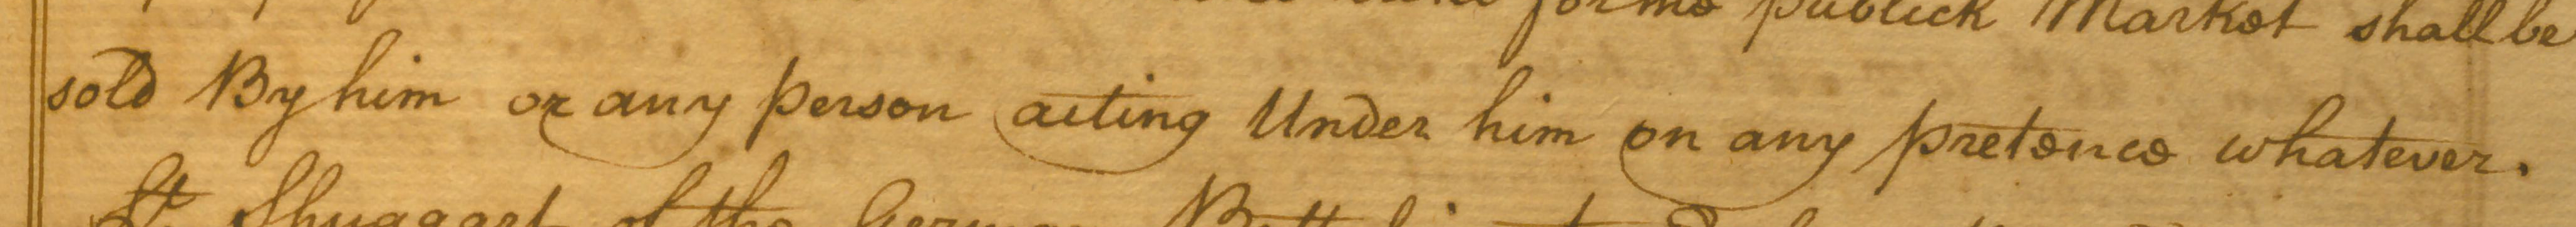sold By him or any person acting Under him on any pretence whatever.
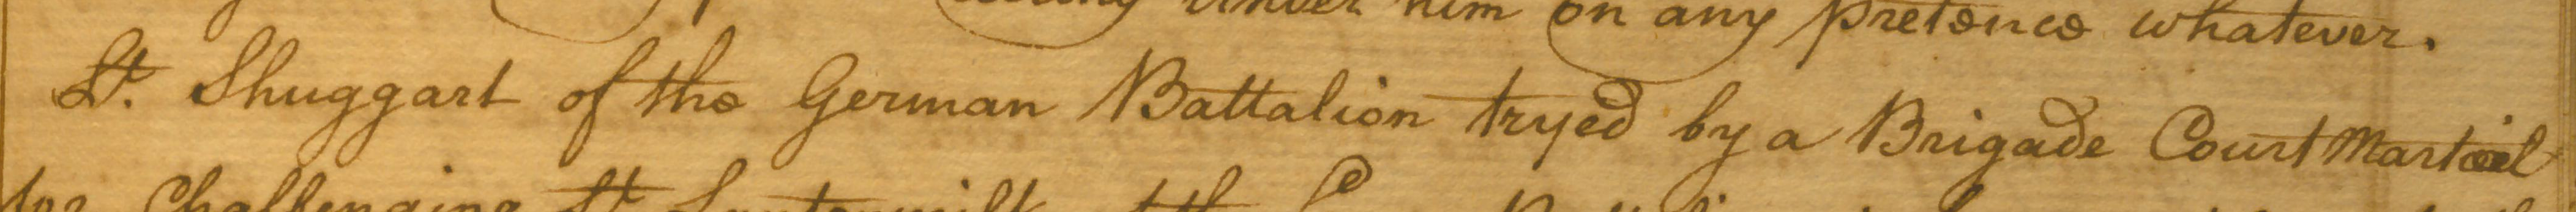L^t. Shuggart of the German Battalion tryed by a Brigade Court Martial
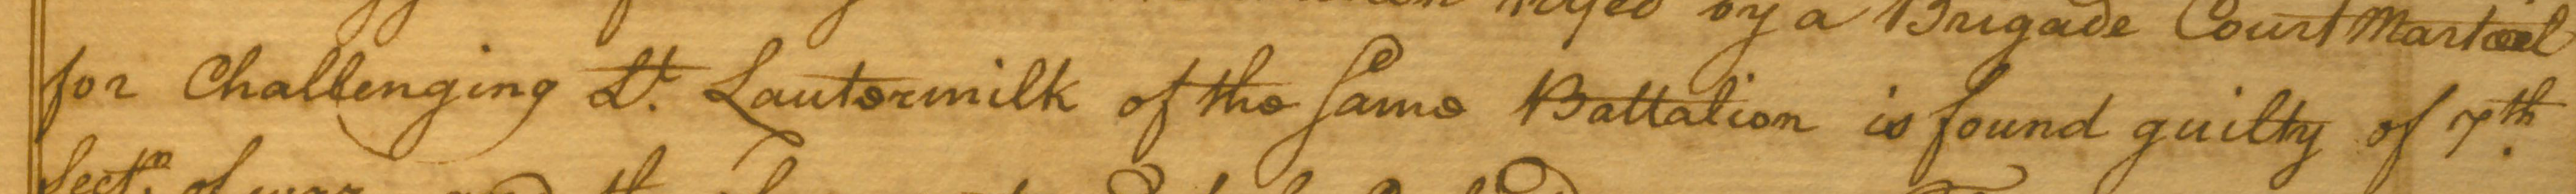for Challenging L^t. Lautermilk of the same Battalion is found guilty of 7^th.
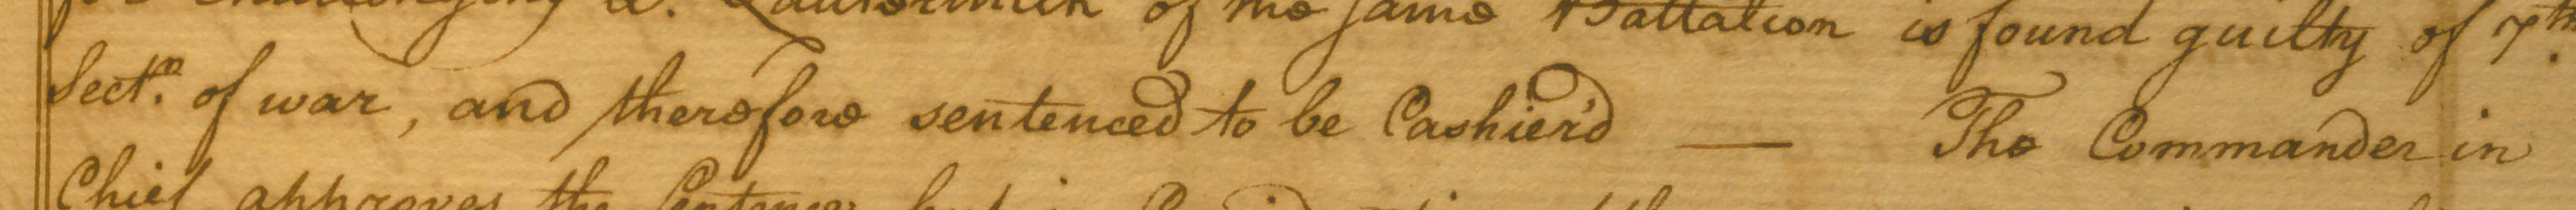Sect^n. of war, and therefore sentenced to be Cashier'd- The Commander in
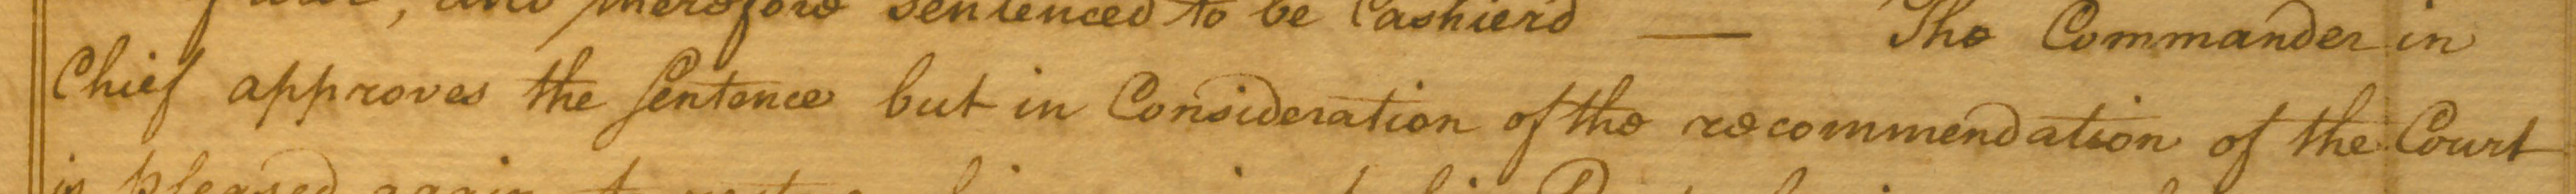Chief approves the sentences but in Consideration of the recommendation of the Court
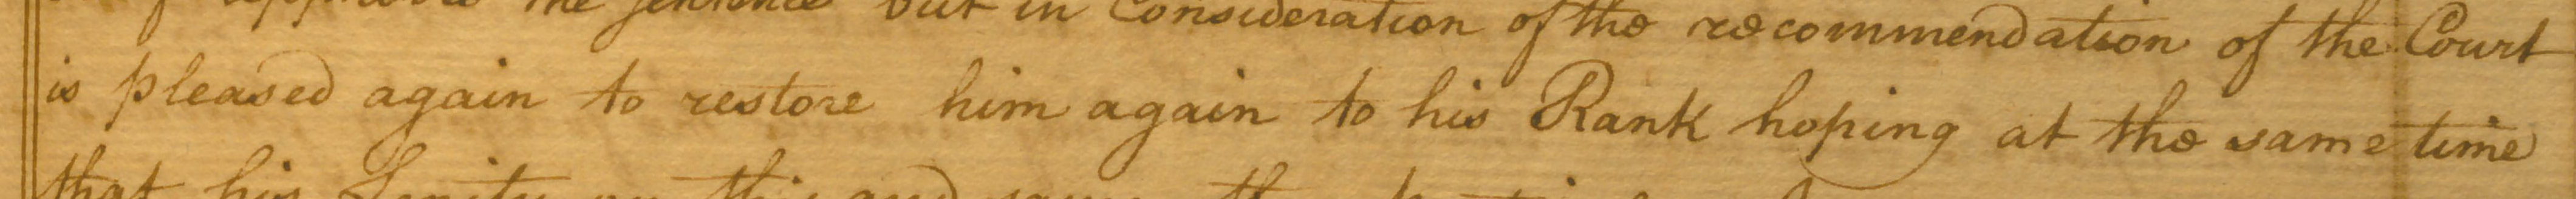is pleased again to restore him again to his Rank hoping at the same time
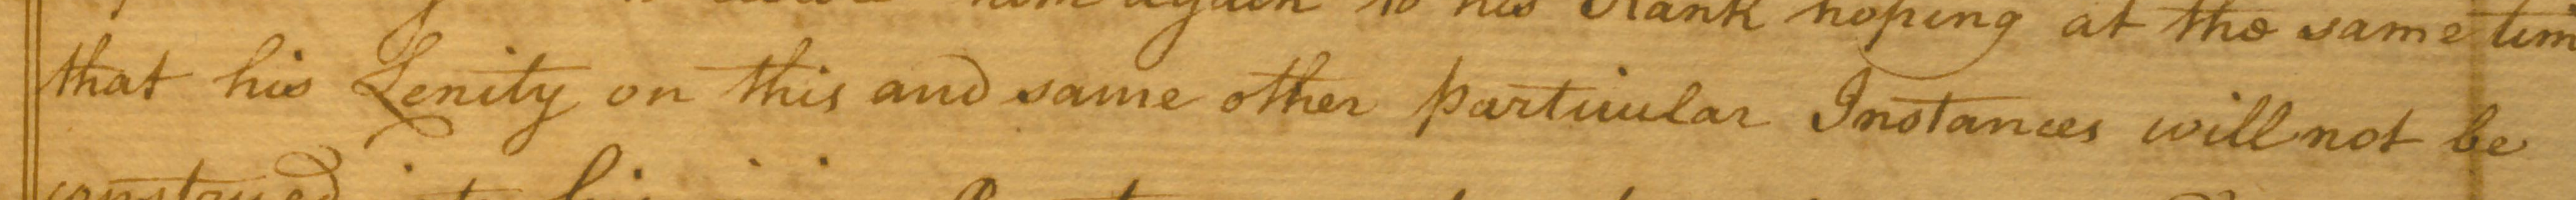that his Lenity on this and same other particular Instances will not be
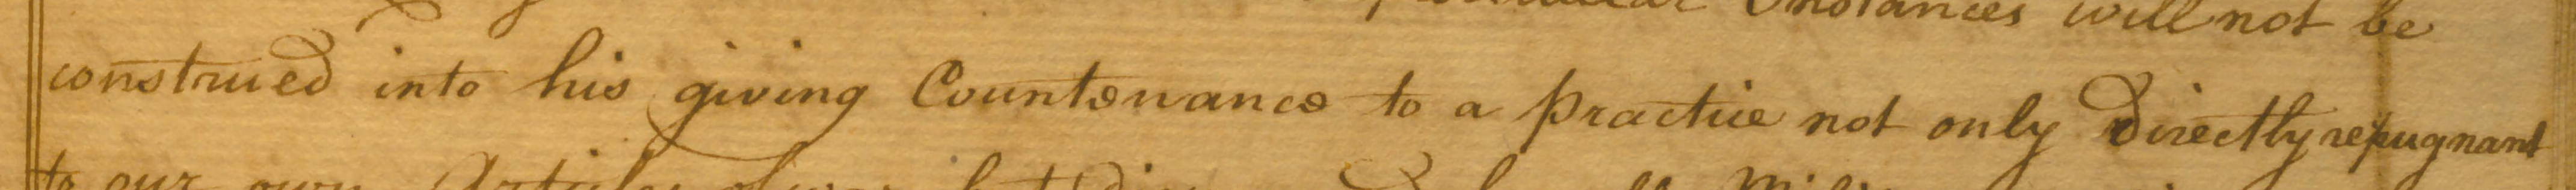construed into his giving Countenance to a practice not only directly repugnant
